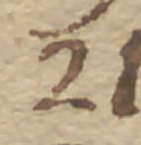21
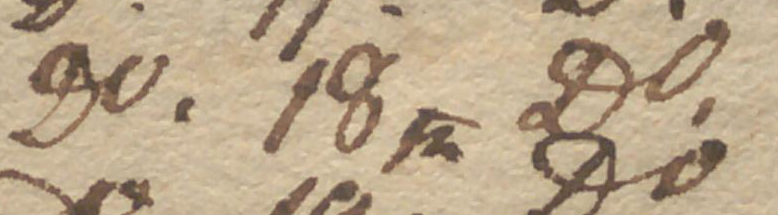D^o. 18th D^o.
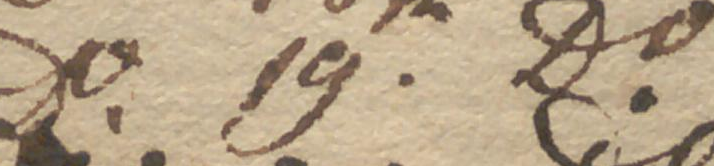D^o. 19^th. D^o.
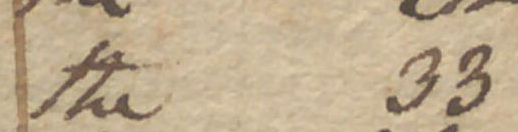the 33
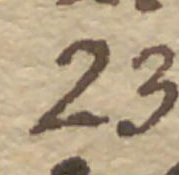23
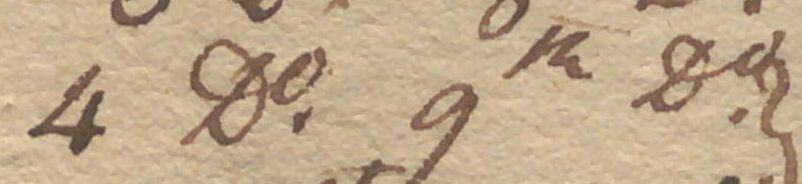4 D^o. 9^th D^o.
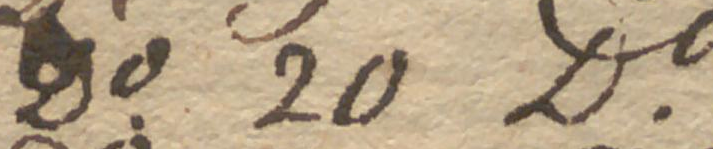D^o 20 D^o.
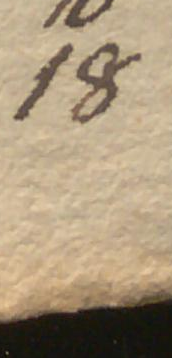18
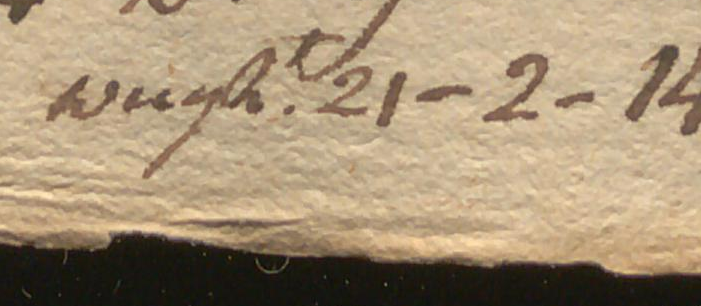weigh^t. 21-2-14
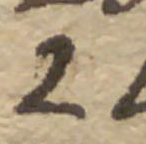24
